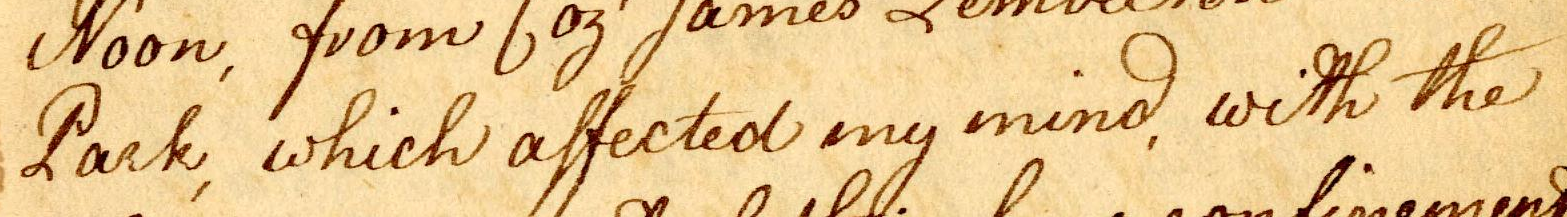Park, which affected my mind with the
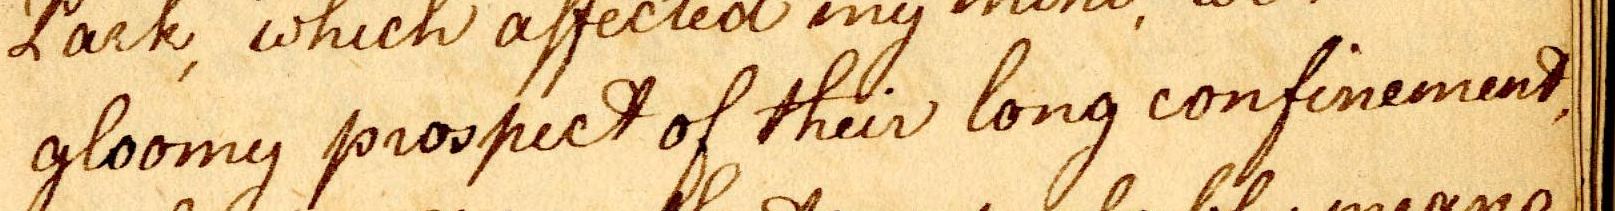gloomy prospect of their long confinement,
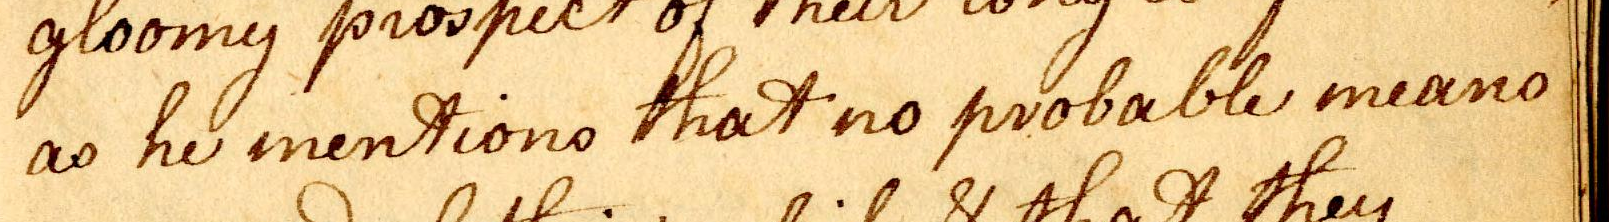as he mentions that no probable means
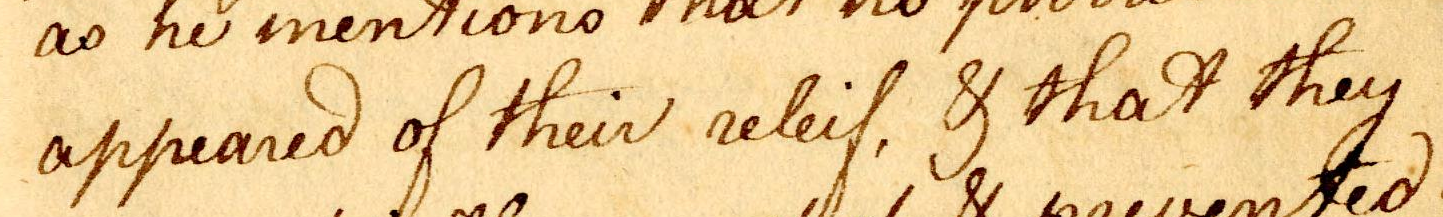appeared of their releif, & that they
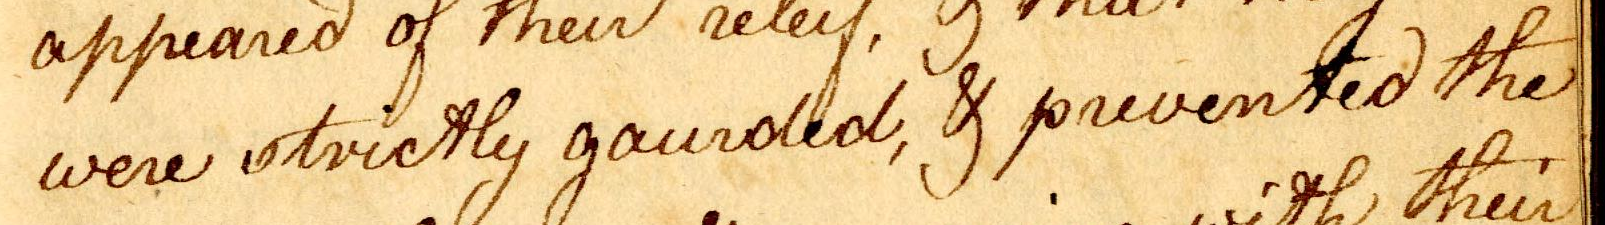were strictly gaurded, & prevented the
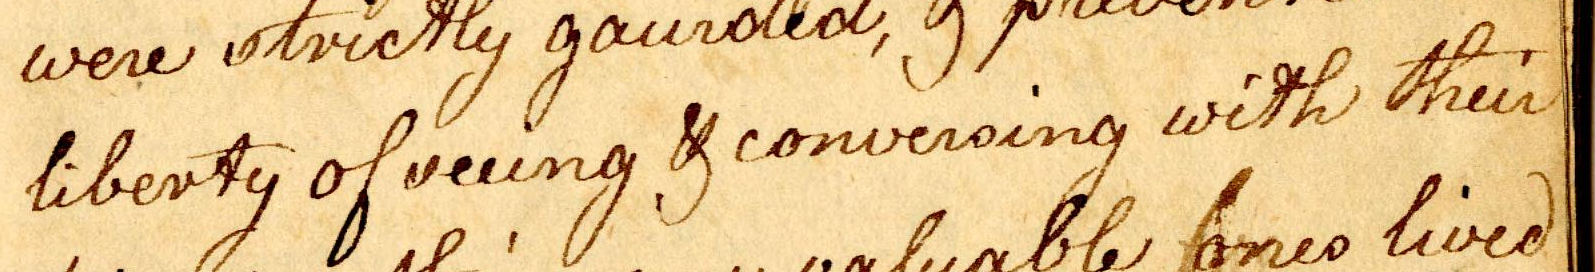liberty of seeing & conversing with their
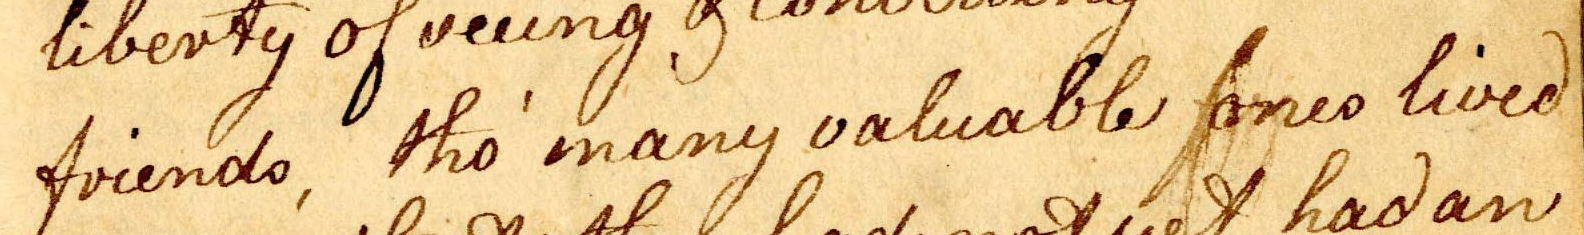friends, tho' many valuable ones lived
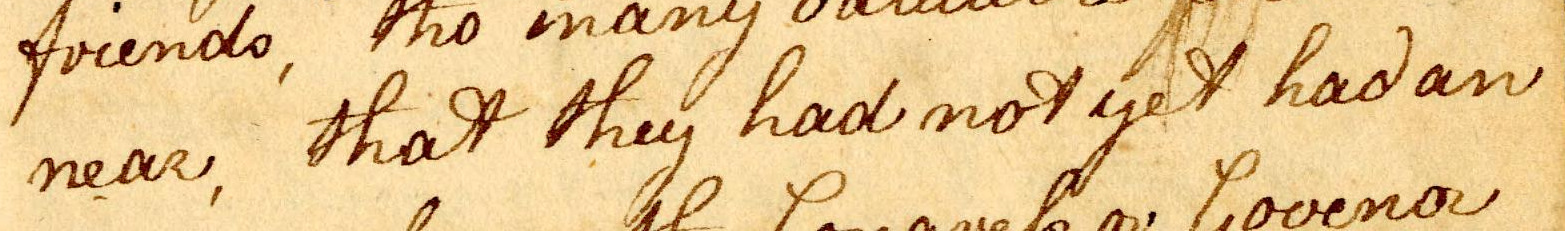near, that they had not yet had an
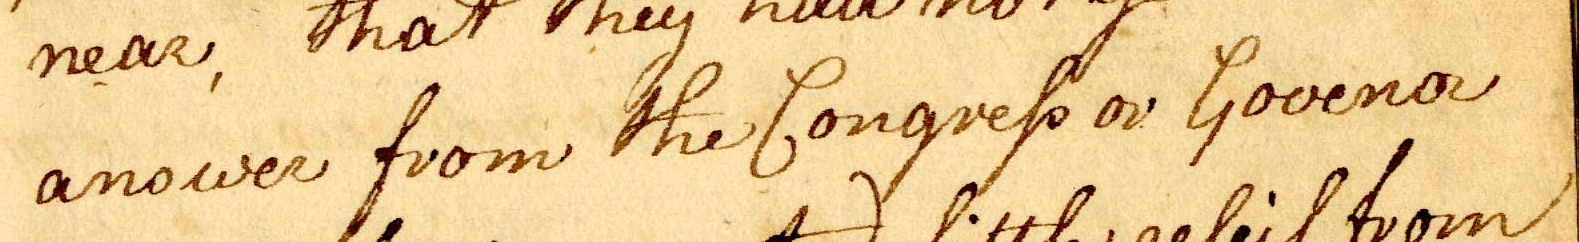answer from the Congress or Govenor
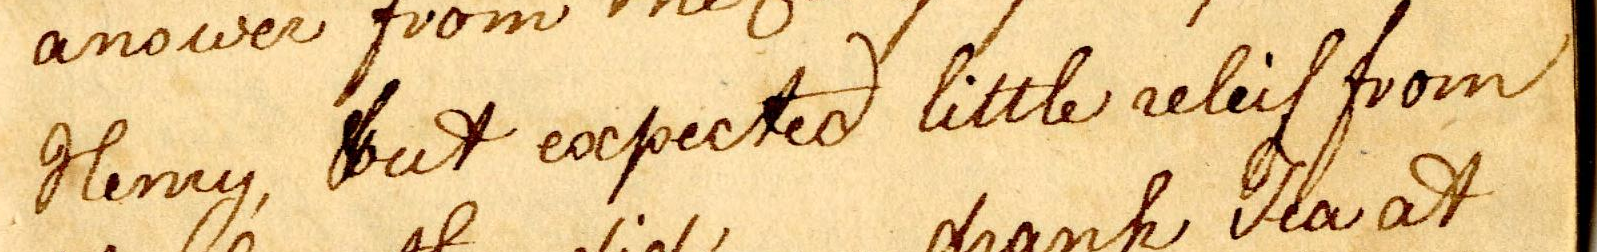Henry, but expected little releif from
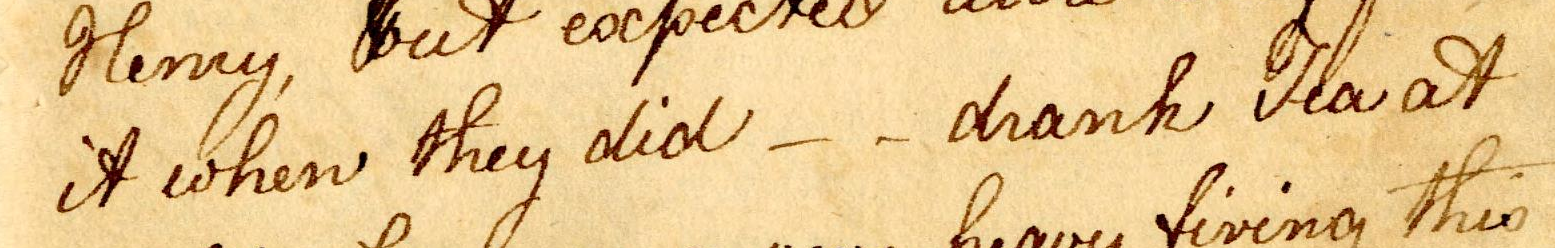it when they did-- drank Tea at
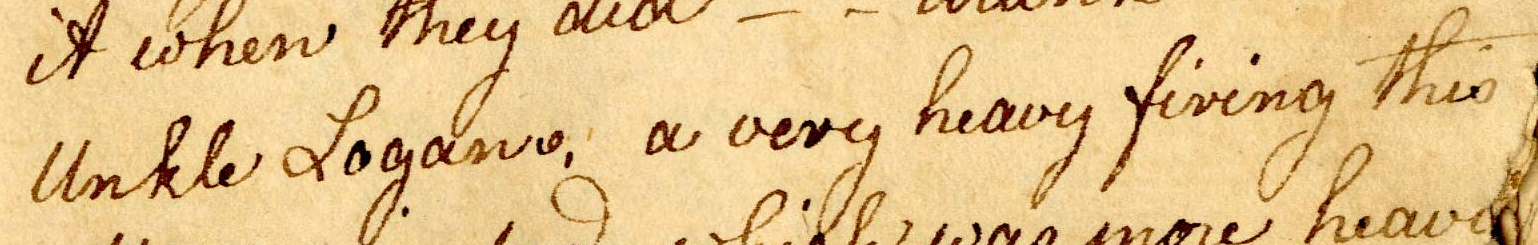Unkle Logans, a very heavy firing this
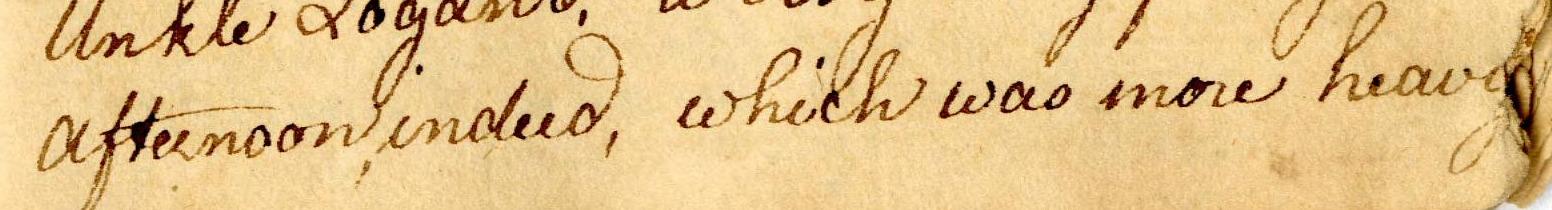Afternoon indeed, which was more heavy
